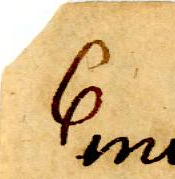6
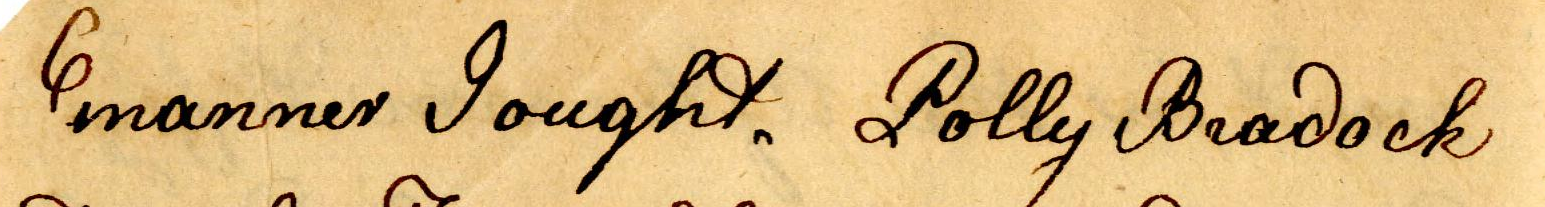manner I ought, Polly Bradock
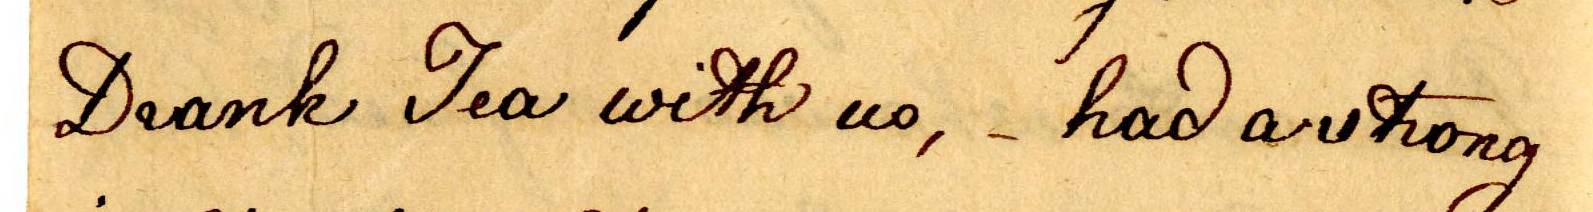Drank Tea with us, - had a strong
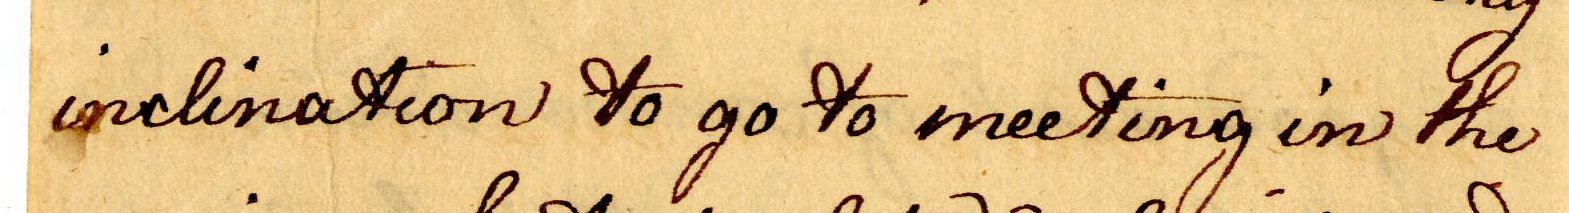inclination to go to meeting in the
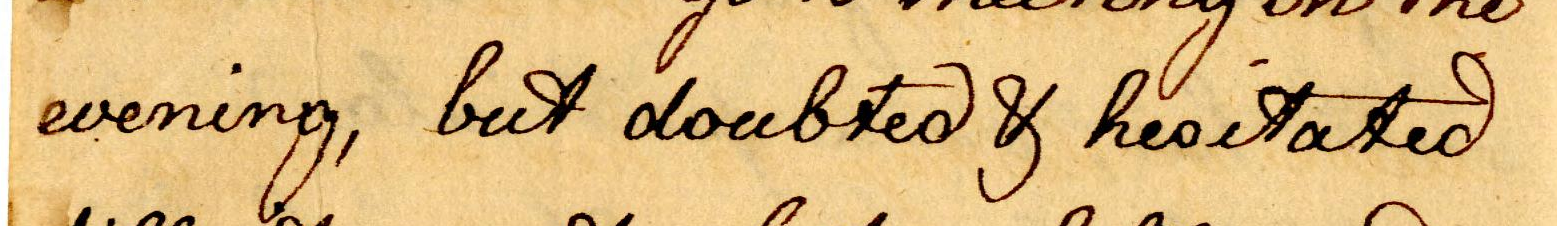evening, but doubted & hesitated
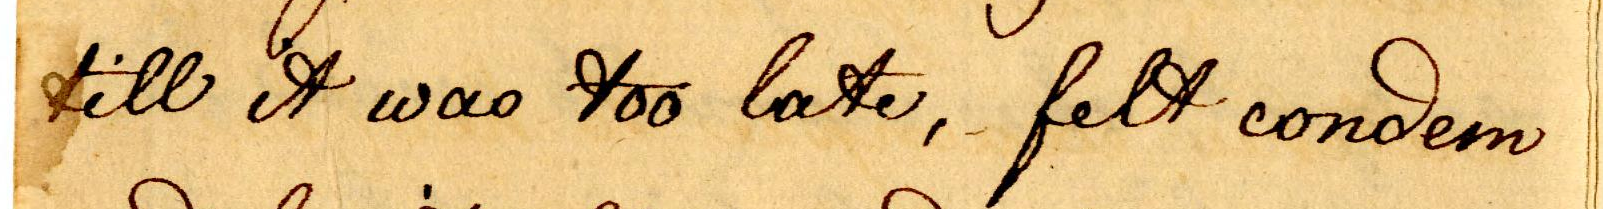till it was too late, felt condem
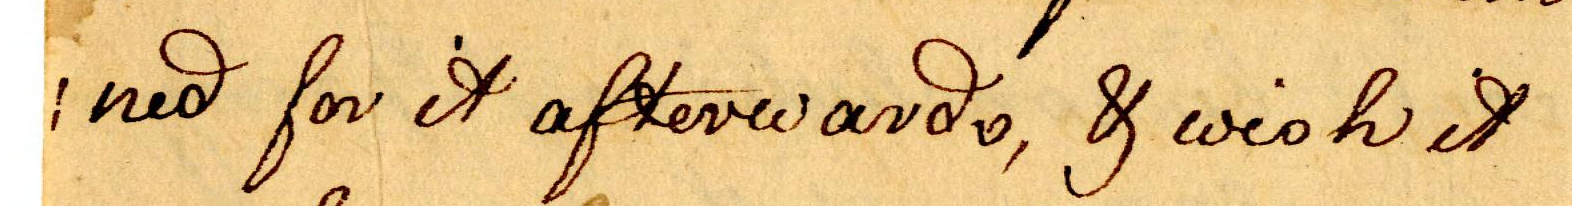-ned for it afterwards, & wish it
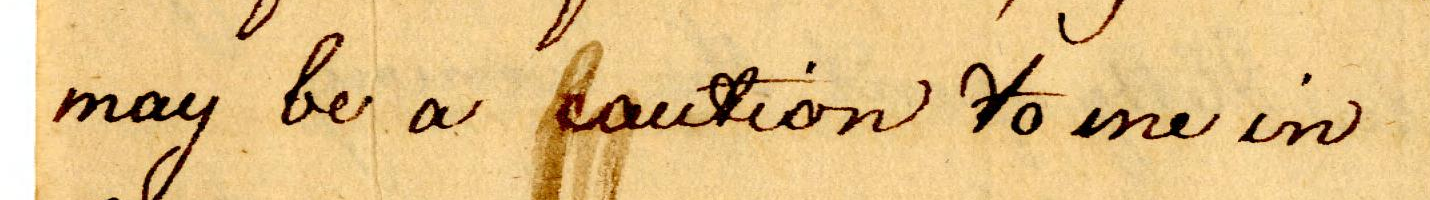may be a caution to me in
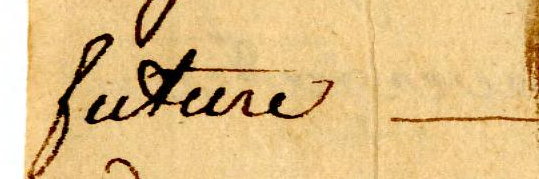future-
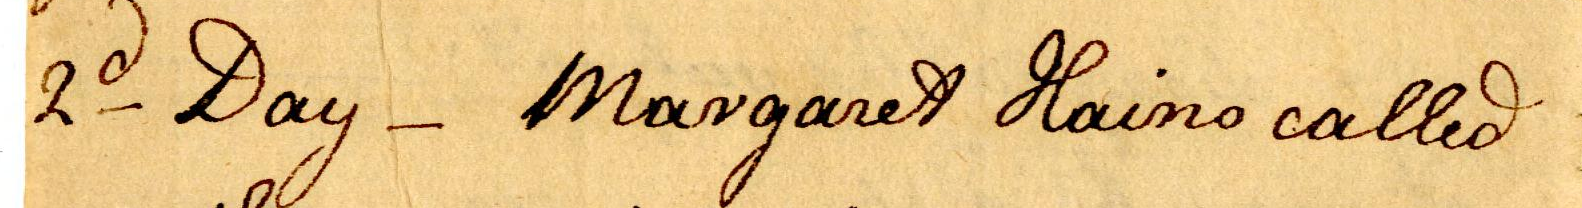2^d Day- Margaret Hains called
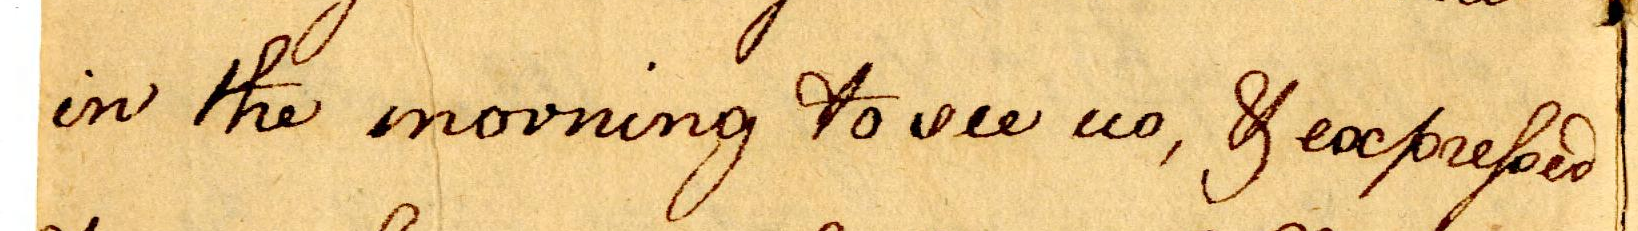in the morning to see us, & expressed
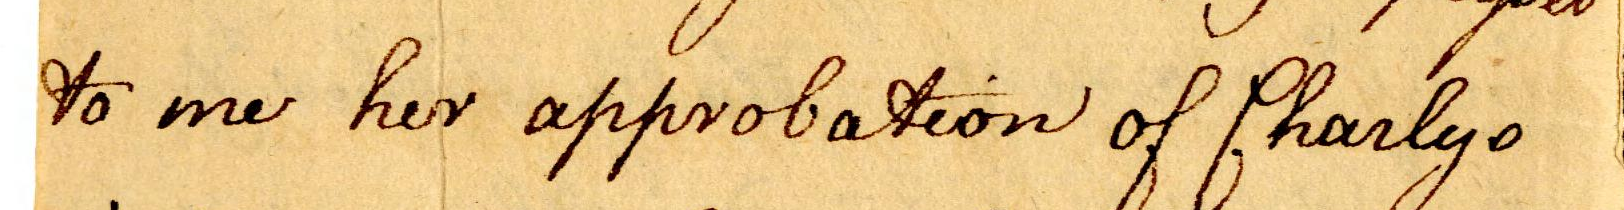to me her approbation of Charlys
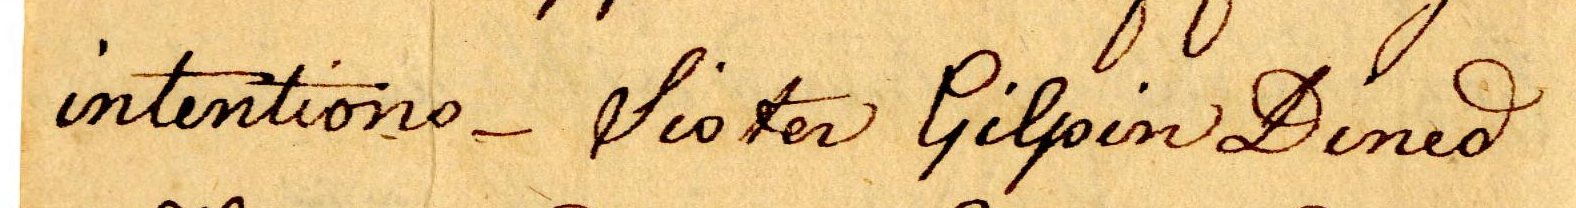intentions- Sister Gilpin Dined
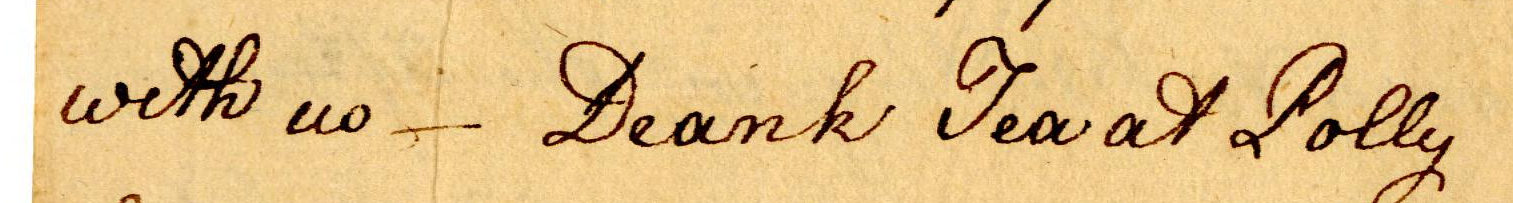with us- Drank Tea at Polly
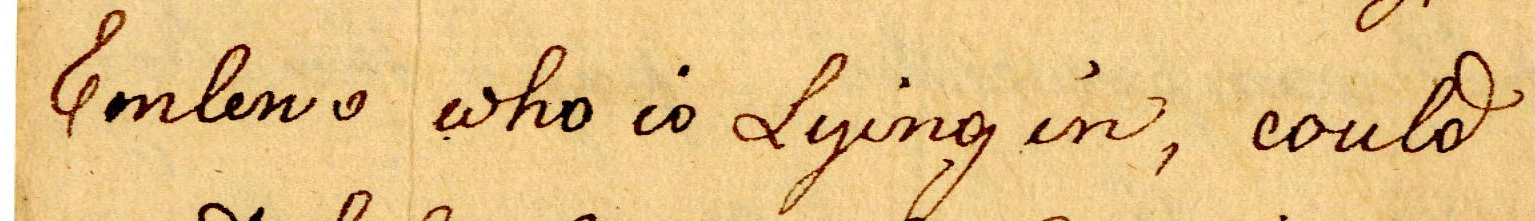Emlens who is Lying in, could
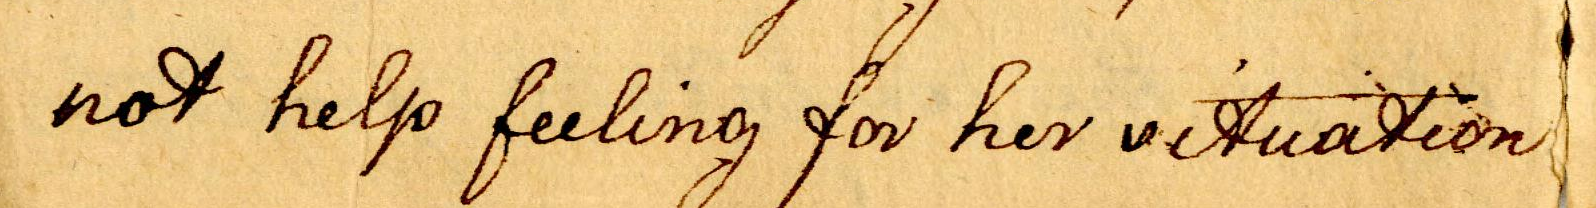not help feeling for her situation
